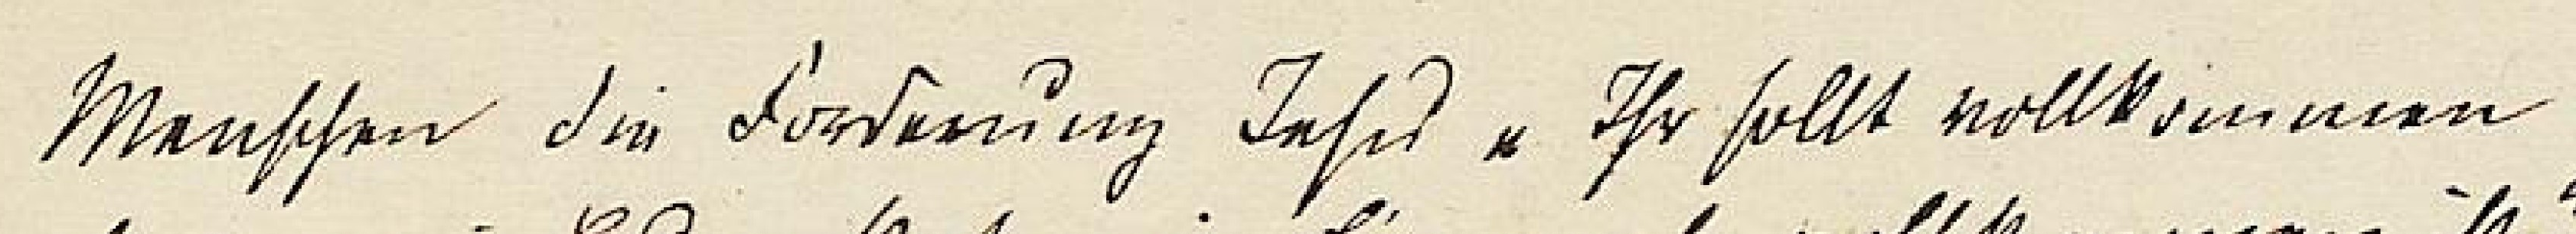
Menschen, die Forderung Jesu "Ihr sollt volkommen
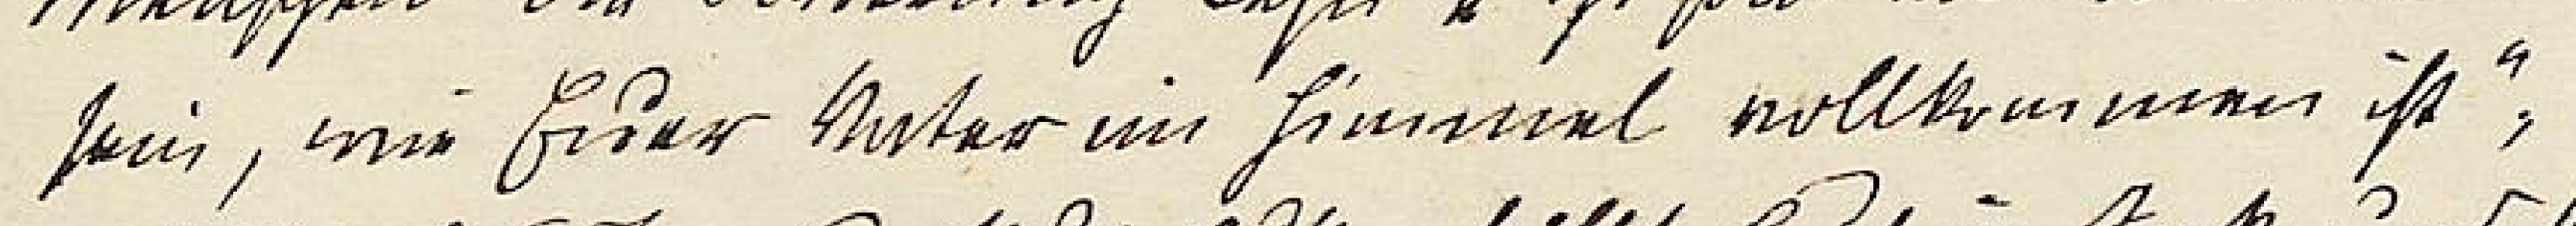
sein, wie Euer Vater im Himmel vollkommen ist",
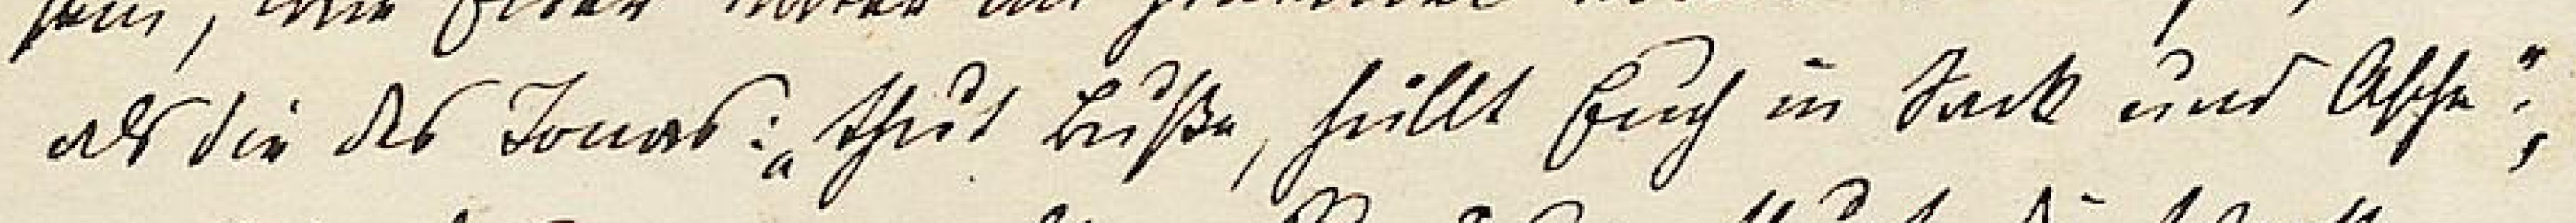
als die des Jonas: "thut Buße, hüllt Euch in Sack und Asche.",
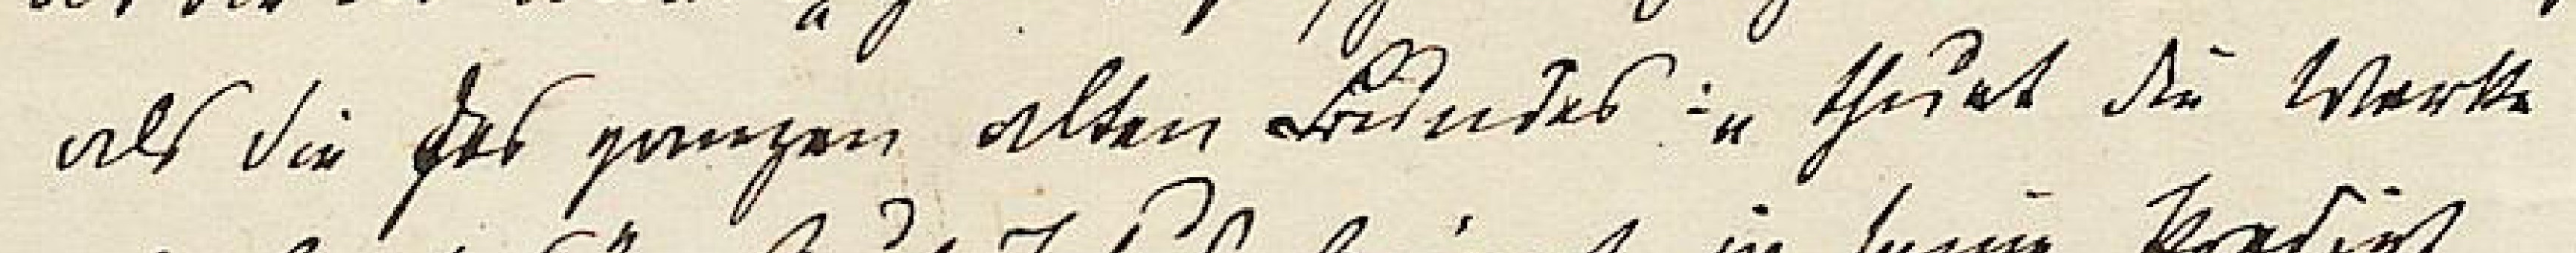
als die des ganzen alten Bundes: "thut die Werke
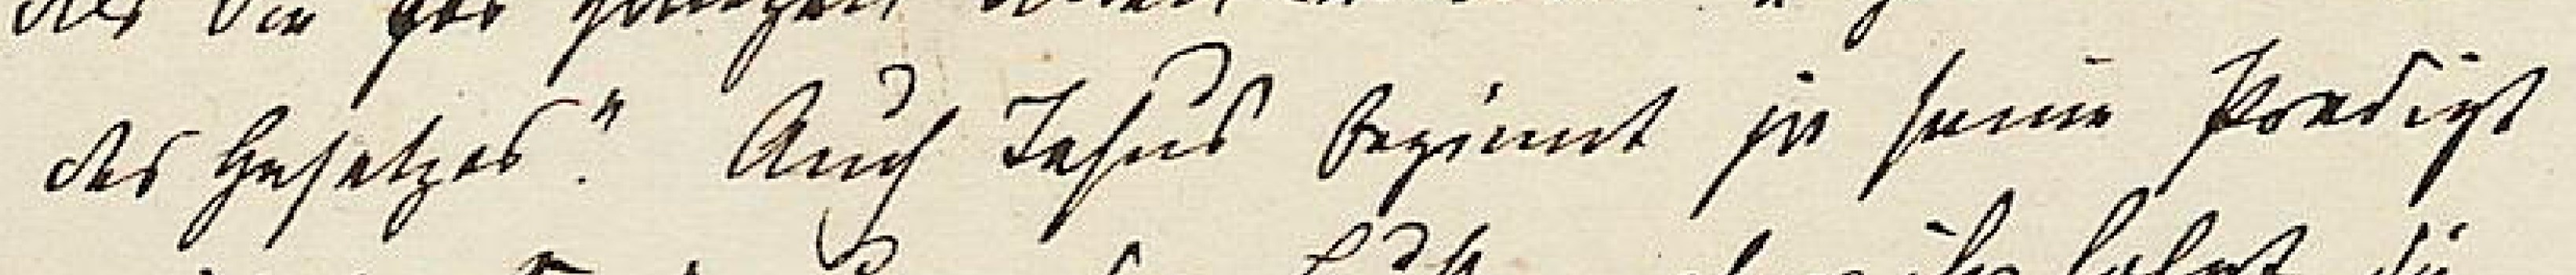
des Gesetzes." Auch Jesus beginnt ja seinme Predigt
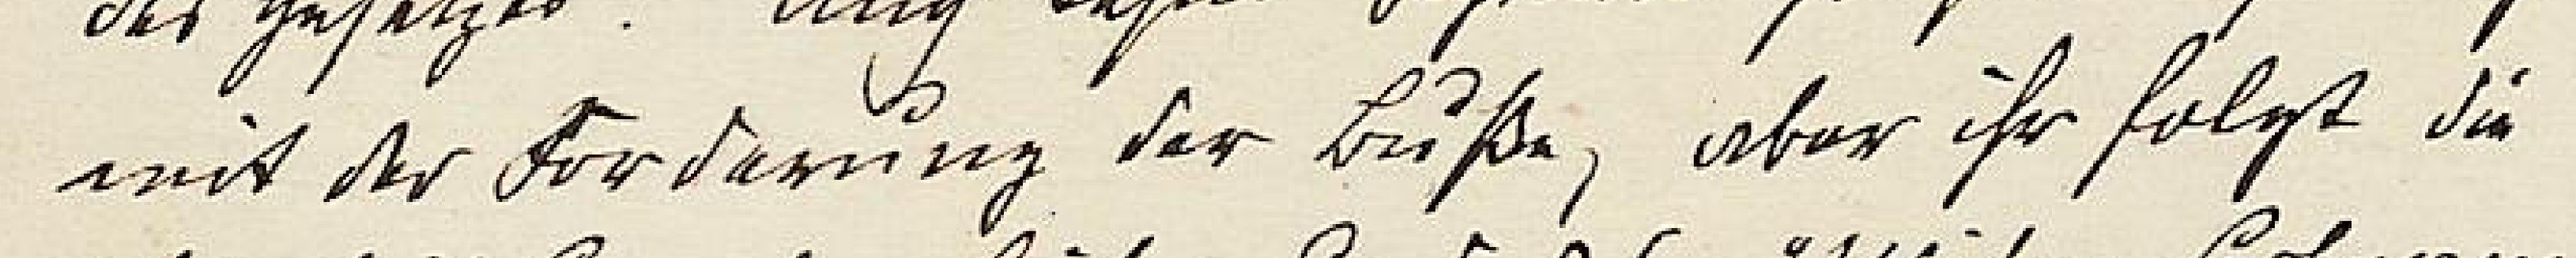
mit der Forderung der Buße, aber ihr folgt die
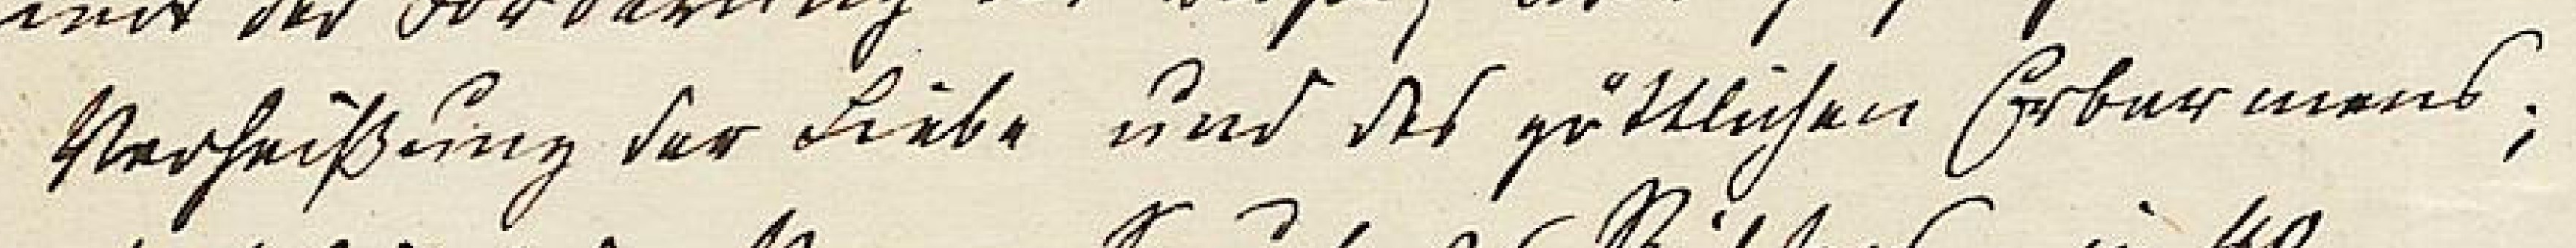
Verheißung der Liebe und des göttlichen Erbarmens;
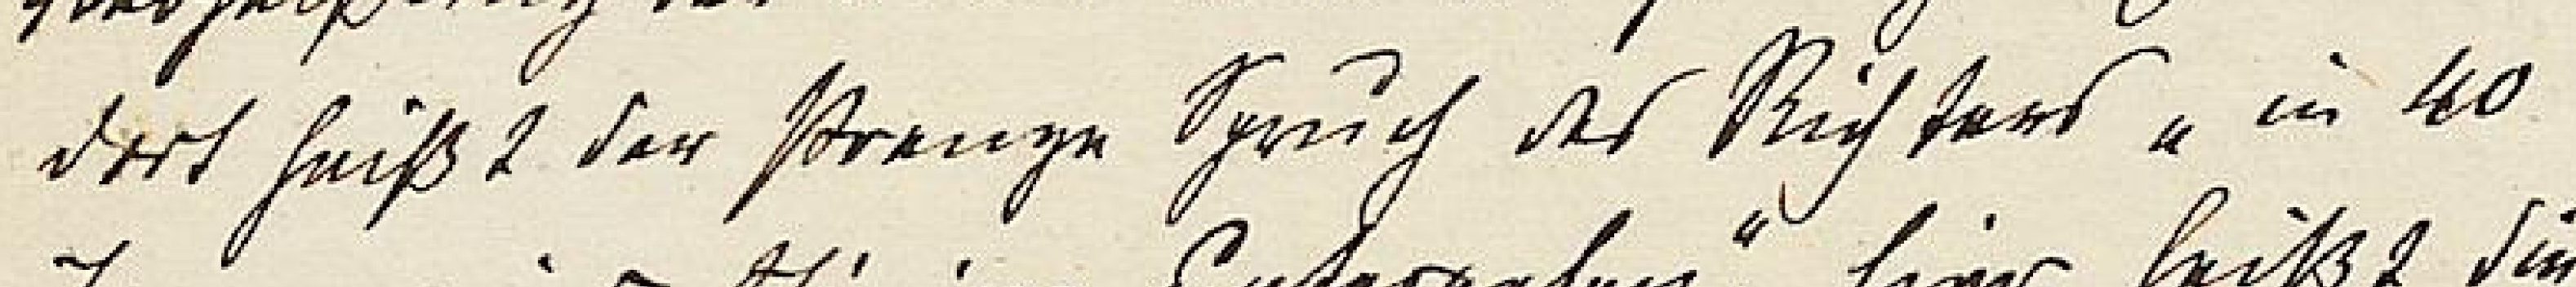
dort heißt der strenge Spruch des Richters "in 40
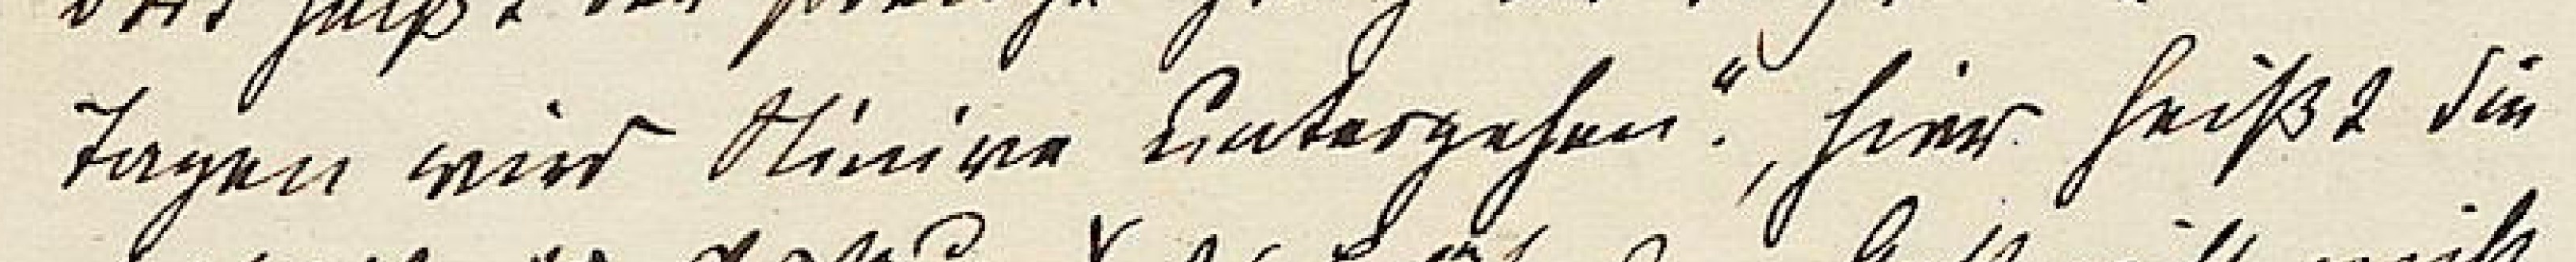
Tagen wird Ninive untergehen." Hier heißt die
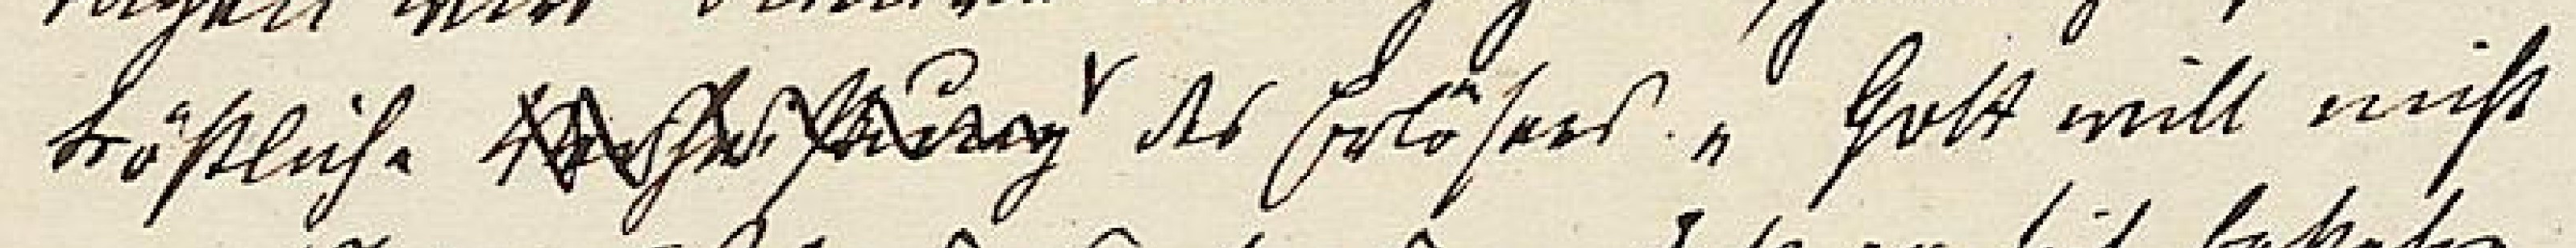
tröstliche Verheisung des Erlösers. "Gott will nicht
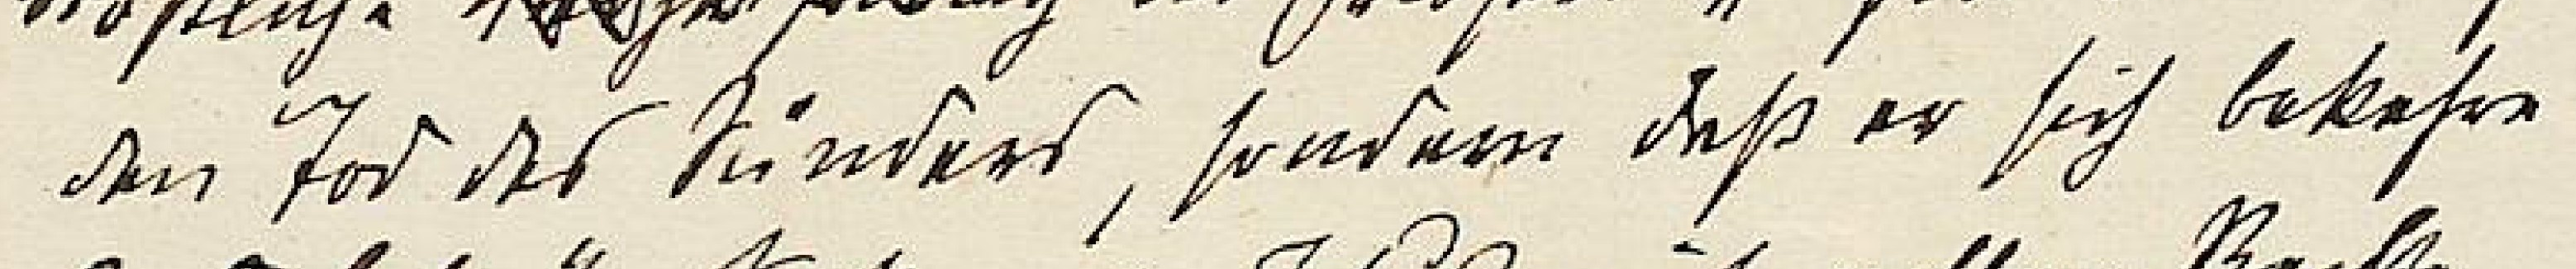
den Tod des Sünders, sondern daß er sich bekehre
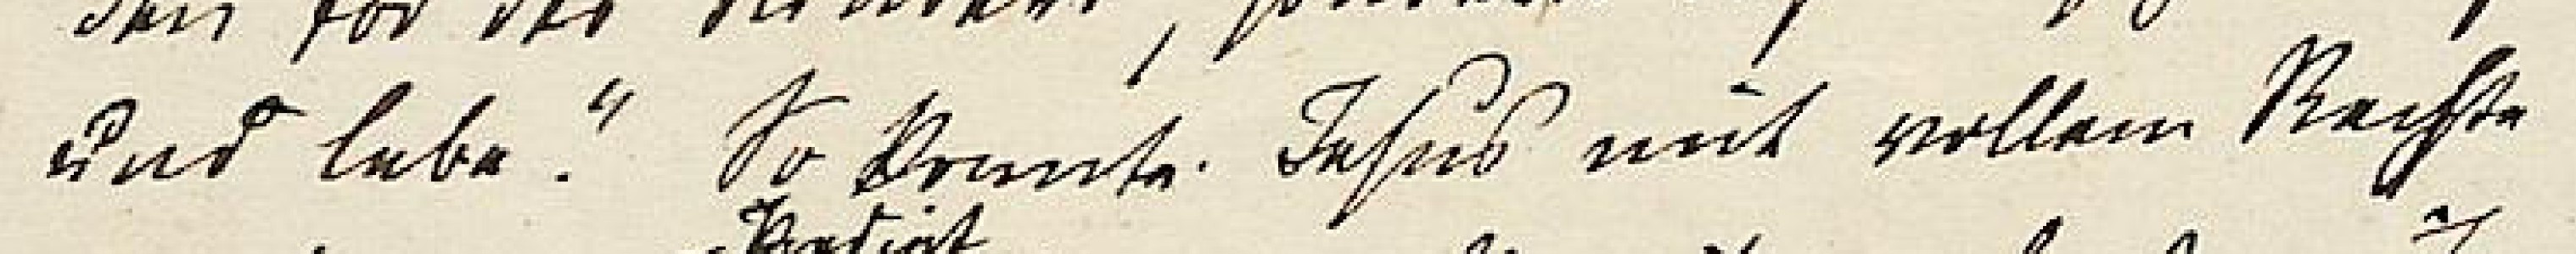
und lebe." So konnte Jesus mit vollem Rechte
